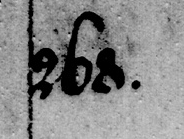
Gemei¬
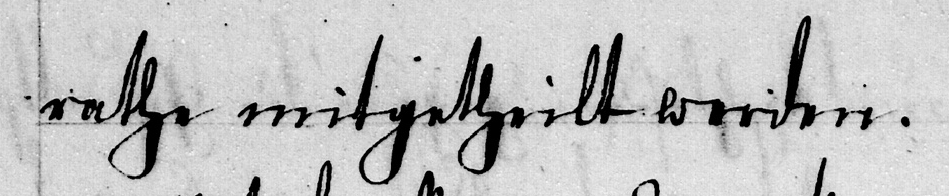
rathe mitgetheilt werden.
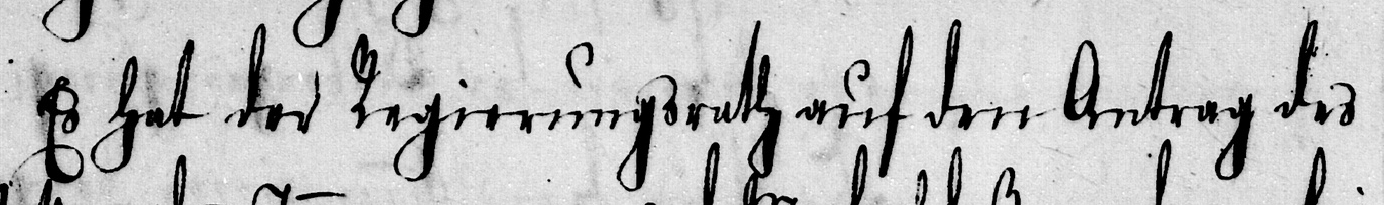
Es hat der Regierungsrath auf den Antrag des
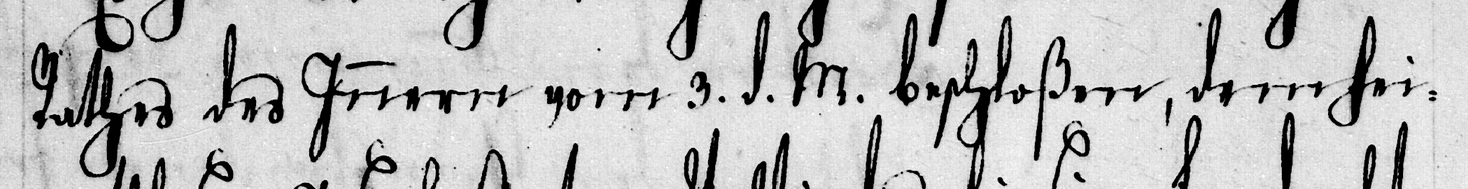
Rathes des Innern vom 3. d. M. beschloßen, dem hei¬
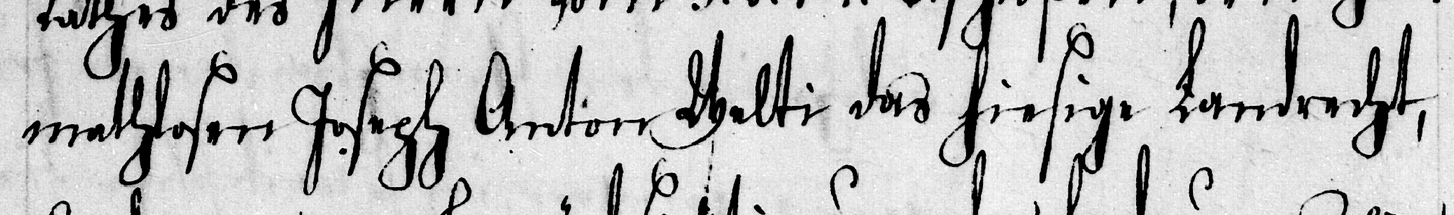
mathlosen Joseph Anton Welti das hiesige Landrecht,
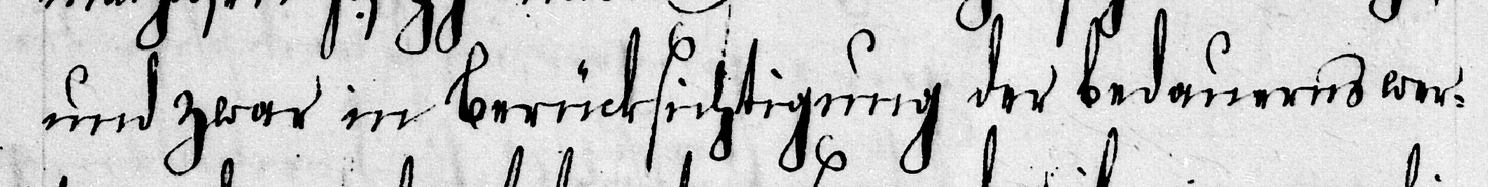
und zwar in Berücksichtigung der bedauernswer¬
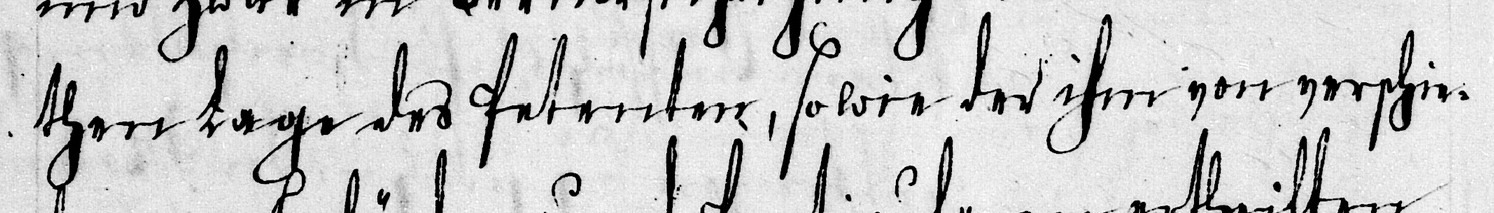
then Lage des Petenten, sowie der ihm von verschie¬
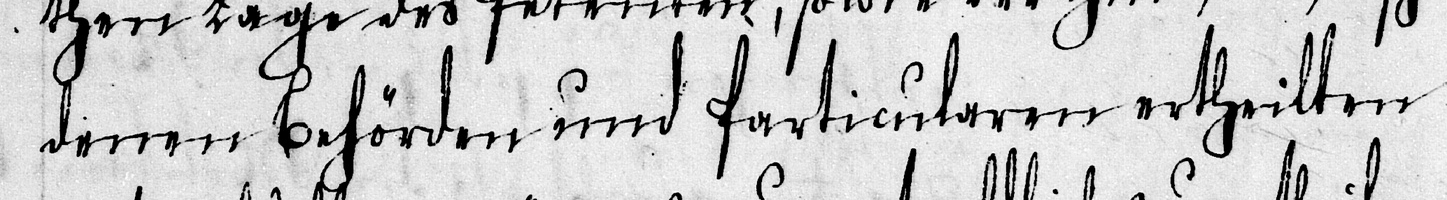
denen Behörden und Particularen ertheilten
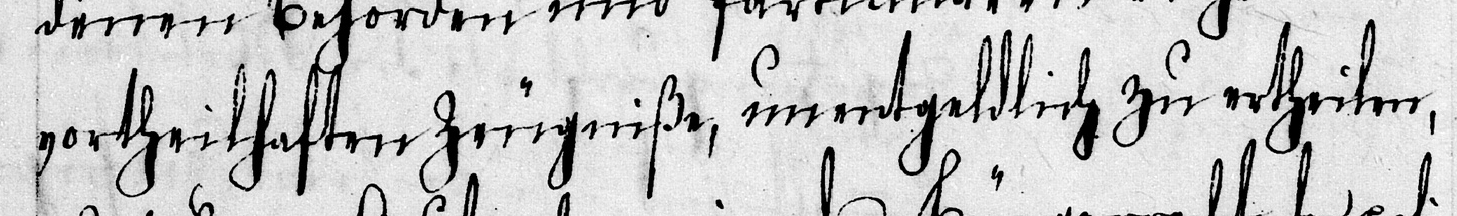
vortheilhaften Zeugniße, unentgeldlich zu ertheilen,
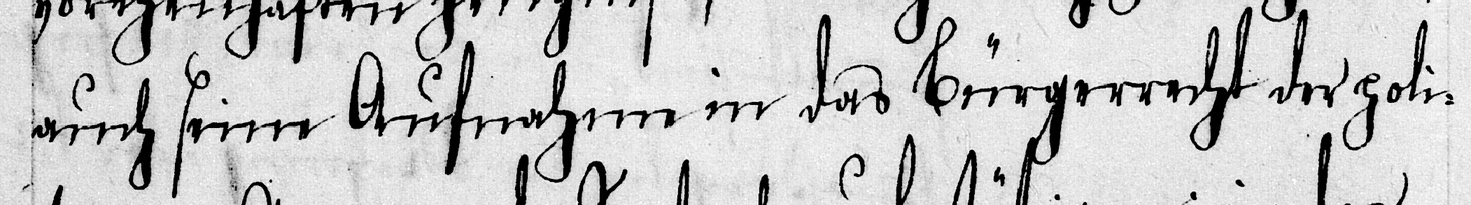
auch seine Aufnahme in das Bürgerrecht der poli¬
